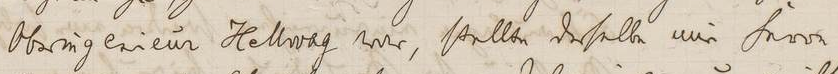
Oberingenieur Hellwag war, stellte derselbe mir Herrn
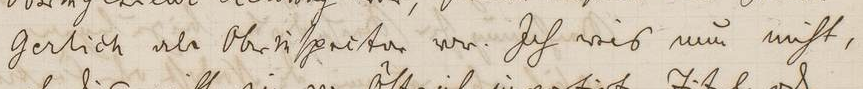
Gerlich als Oberinspector vor. Ich weis nun nicht,
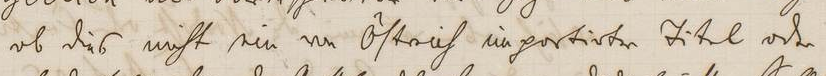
ob dies nicht ein von Östreich importirter Titel oder
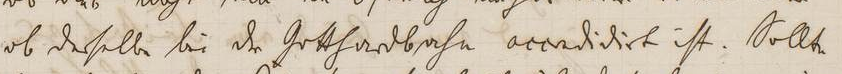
ob derselbe bei der Gotthardbahn accredidirt ist. Sollte
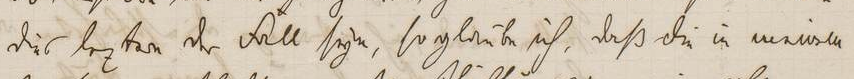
dies leztere der Fall seyn, so glaube ich, daß die in meinem
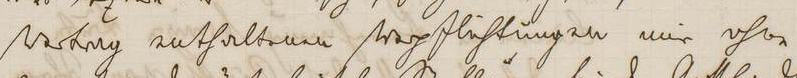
Vertrag enthaltenen Verpflichtungen mir ohne
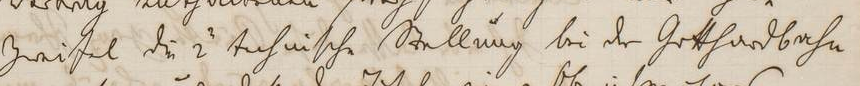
Zweifel die 2t technische Stellung bei der Gotthardbahn
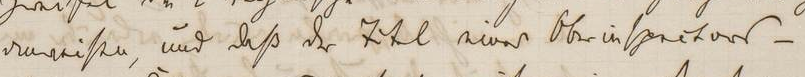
anweiste, und daß der Titel eines Oberinspectors –
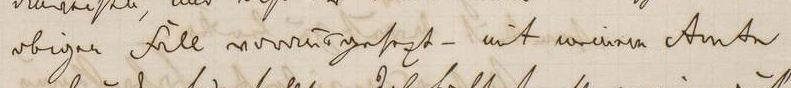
obiger Fall vorausgesetzt – mit meinem Amte
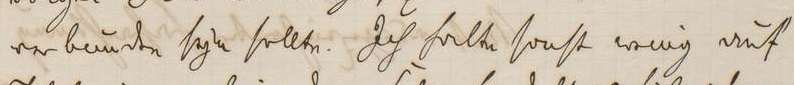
verbunden seyn sollte. Ich halte sonst wenig auf
